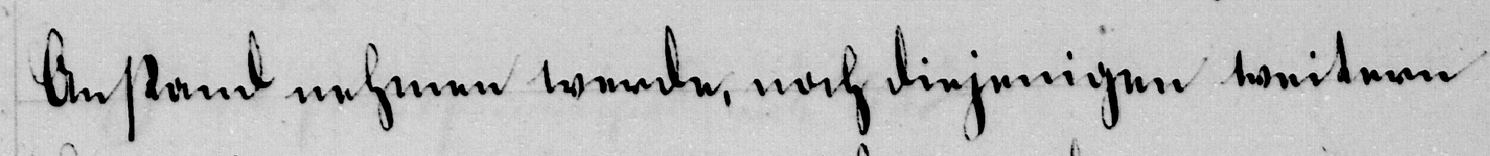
Anstand nehmen werde, noch diejenigen weitern
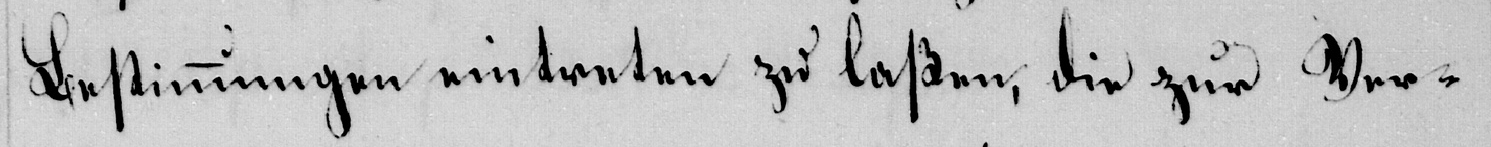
Bestimmungen eintreten zu laßen, die zur Ver¬
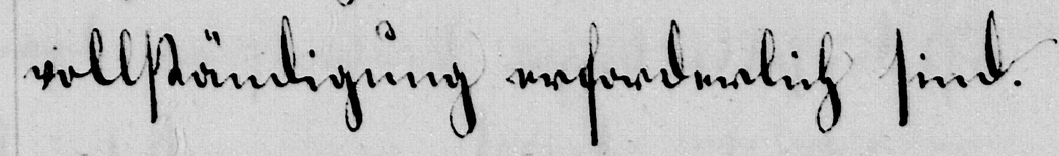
vollständigung erforderlich sind.
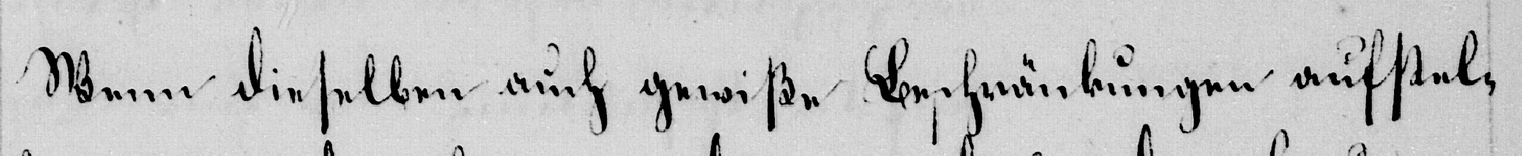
Wenn dieselben auch gewiße Beschränkungen aufstel¬
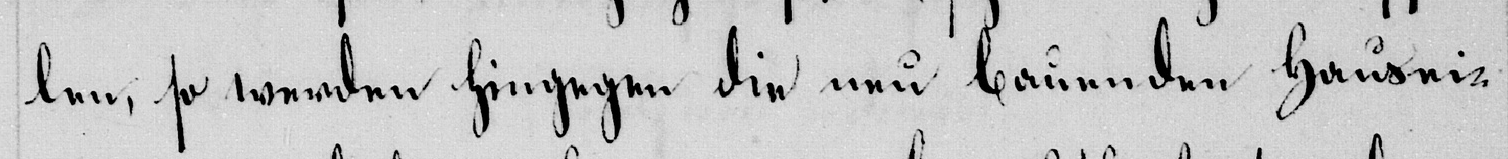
len, so werden hingegen die neu bauenden Hausei¬
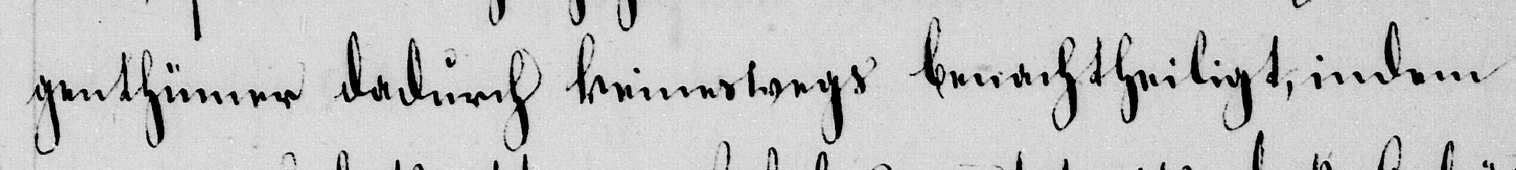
genthümer dadurch keineswegs benachtheiligt, indem
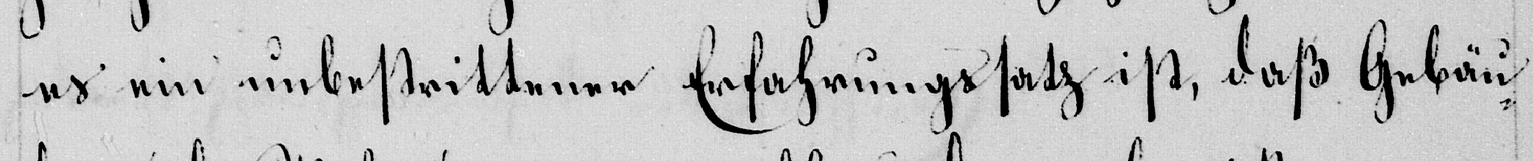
es ein unbestrittener Erfahrungssatz ist, daß Gebäu¬
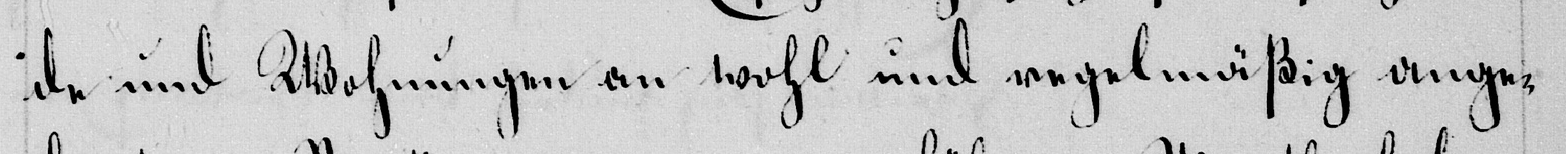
de und Wohnungen an wohl und regelmäßig ange¬
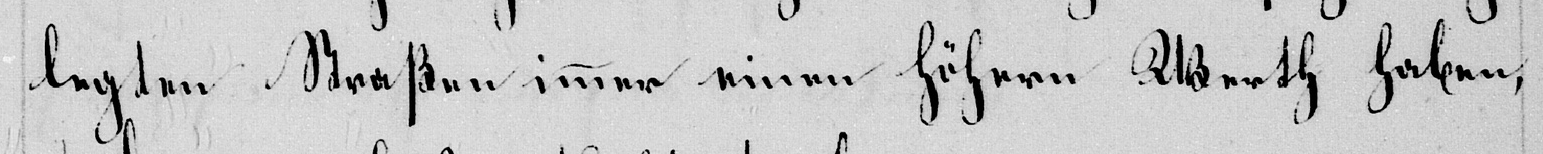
legten Straßen immer einen höhern Werth haben,
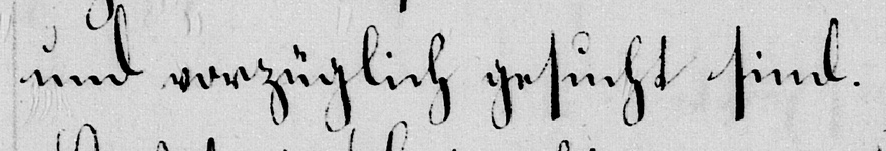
und vorzüglich gesucht sind.
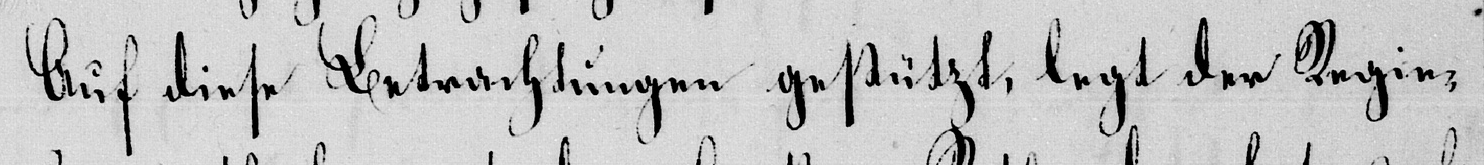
Auf diese Betrachtungen gestützt, legt der Regie¬
